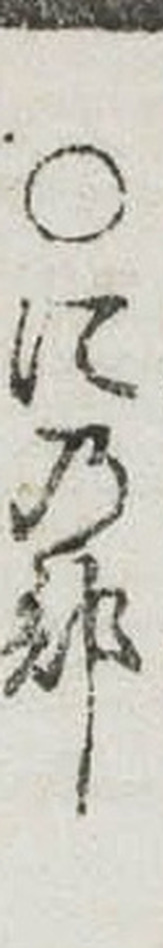○にの部
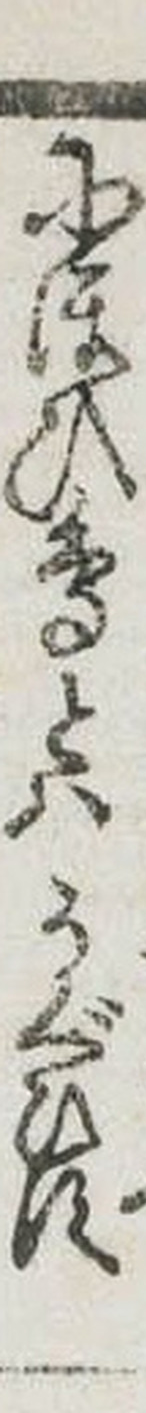にほひ鳥とはうぐひす
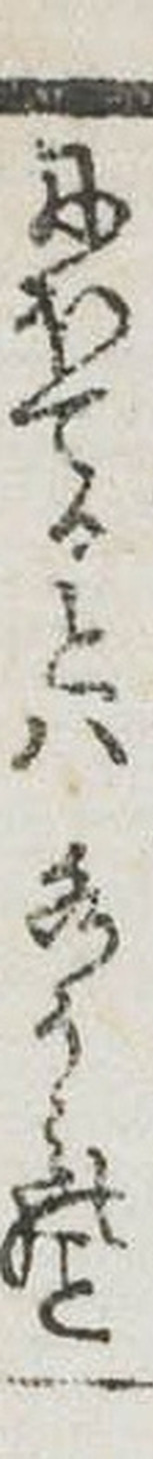にほてるとは水うみのこと
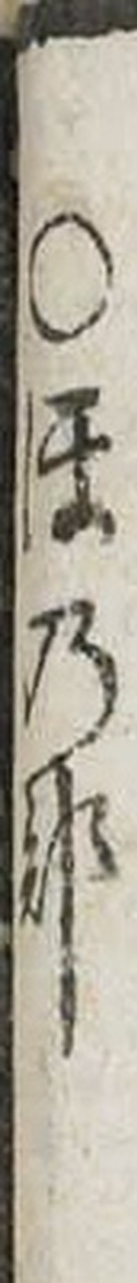○ほの部
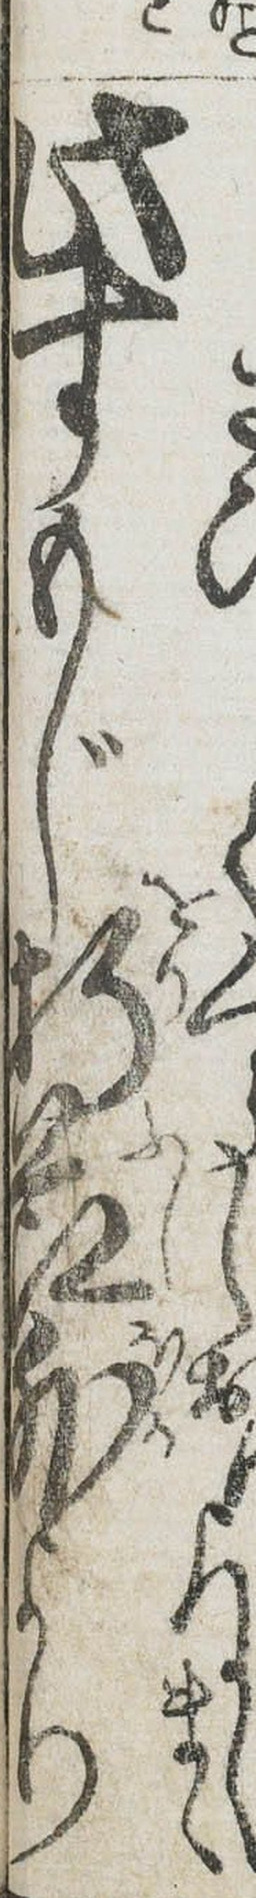此すもじ折節外より
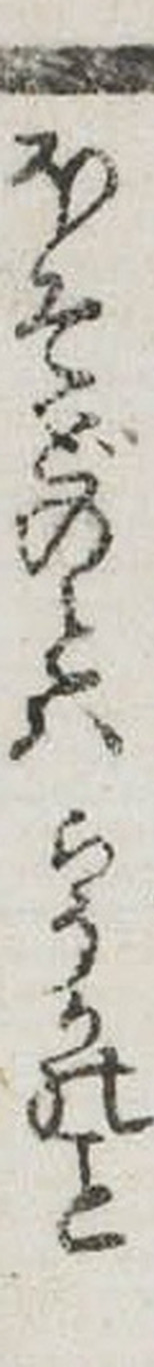ほそどのとはらうかのこと
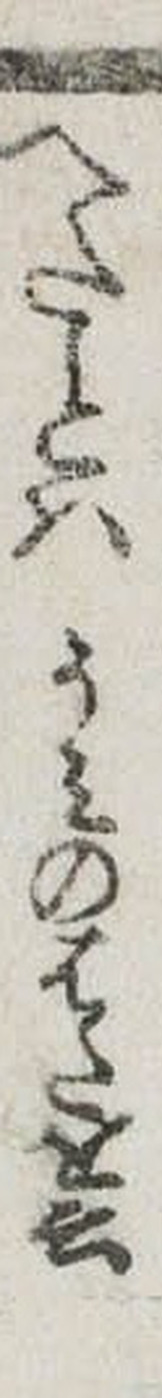へたとはうみのはたを云
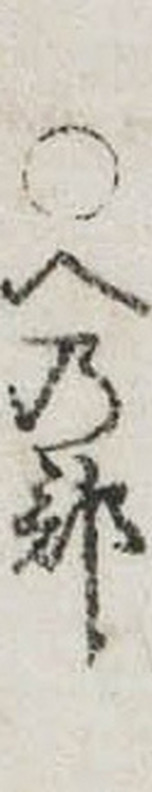○への部
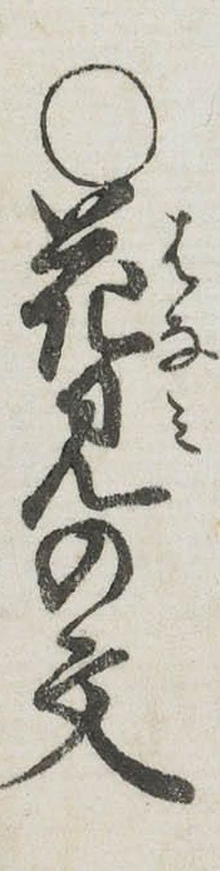○花見の文
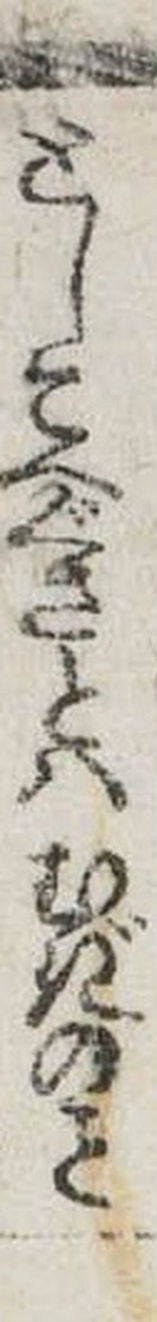としこへぐさとはむぎのこと
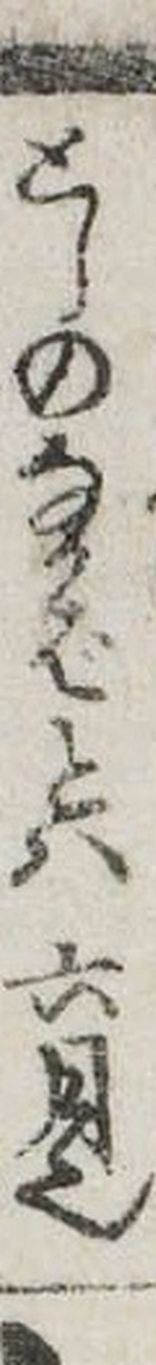としのなかばとは六月也
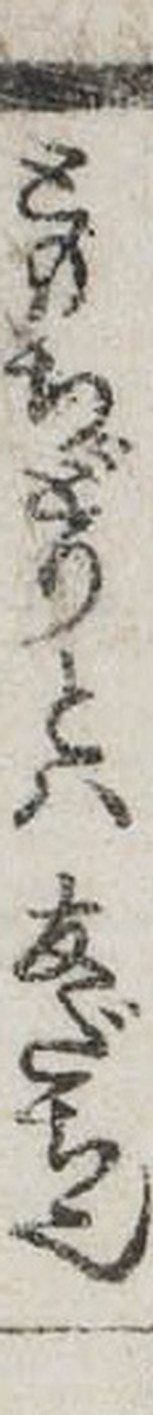ともちどりとは友だち也
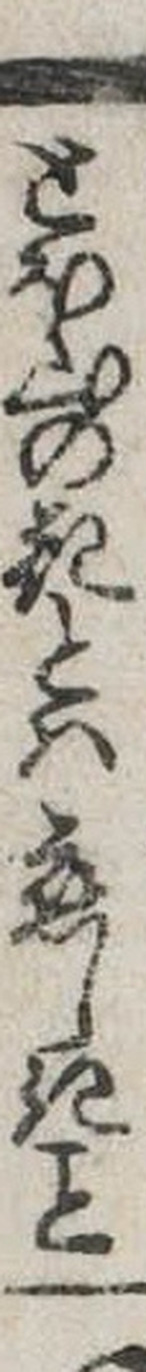とほ山の花とは恋しきこと
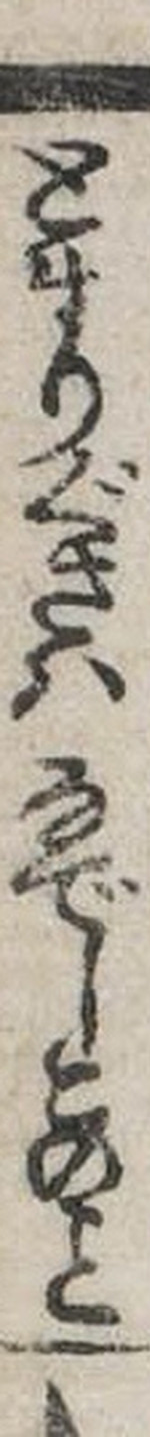とまりぐさはなでしこのこと
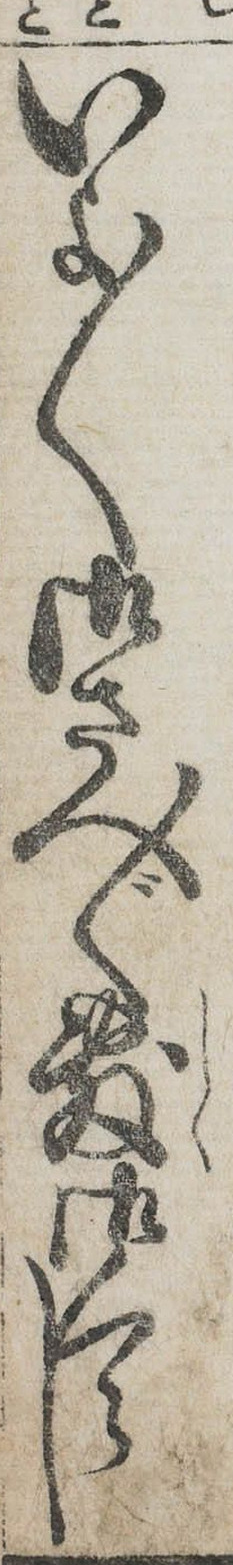いよ〳〵御さへ〴〵敷御くらし

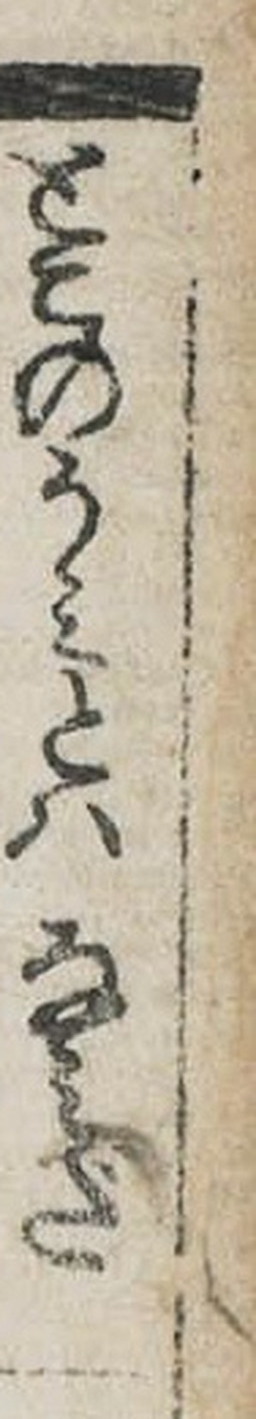とこのうみとはなみだ
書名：頭書萬用婦人手紙之文言
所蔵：東京学芸大学教育コンテンツアーカイブ
